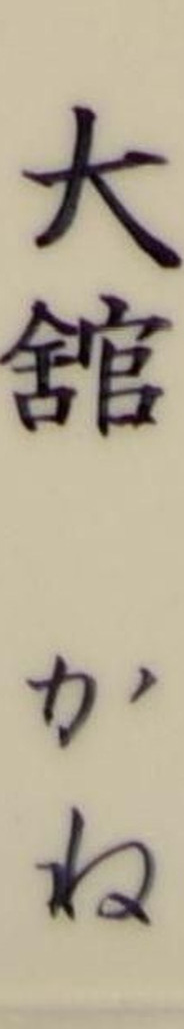大館かね
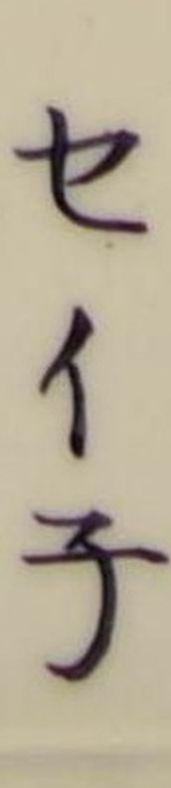セイ子
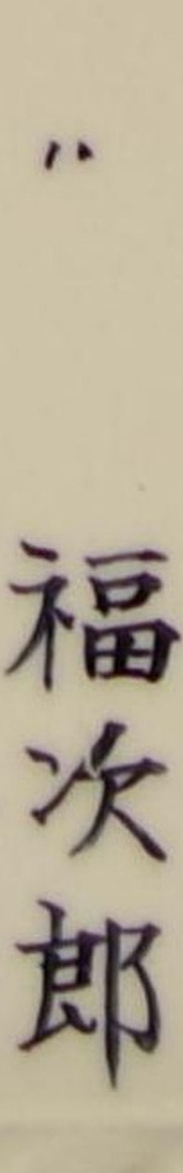福次郎
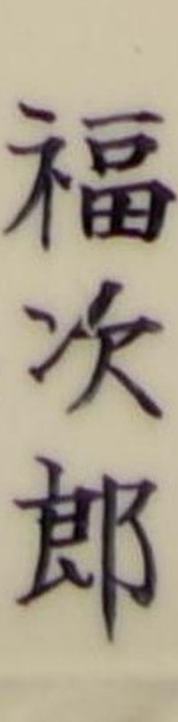福次郎
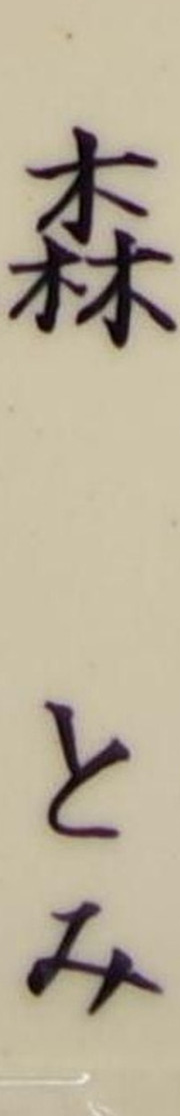森とみ
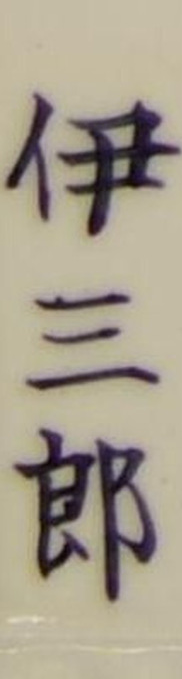伊三郎

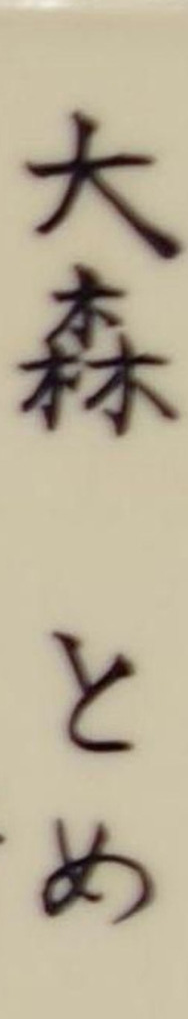大森とめ
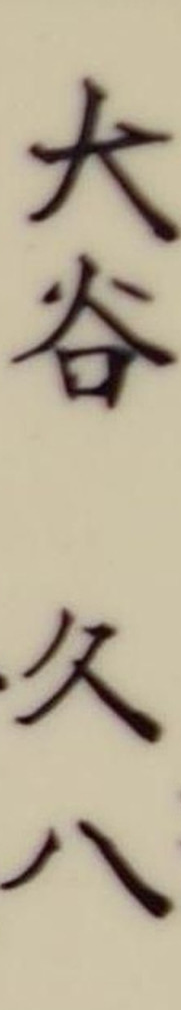大谷久八
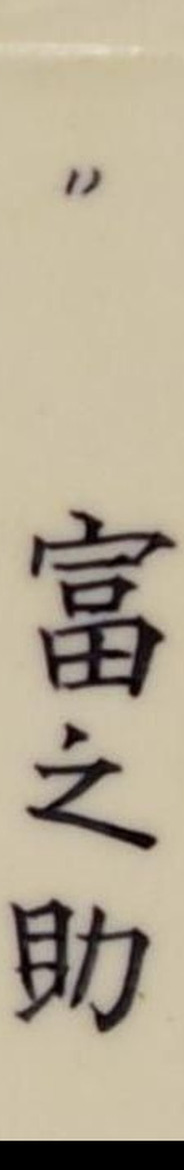富之助
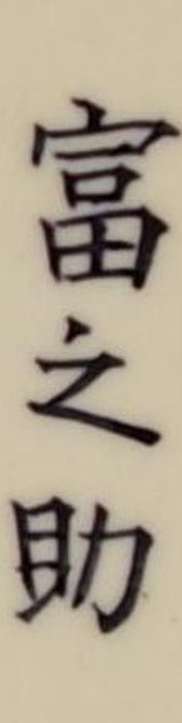富之助
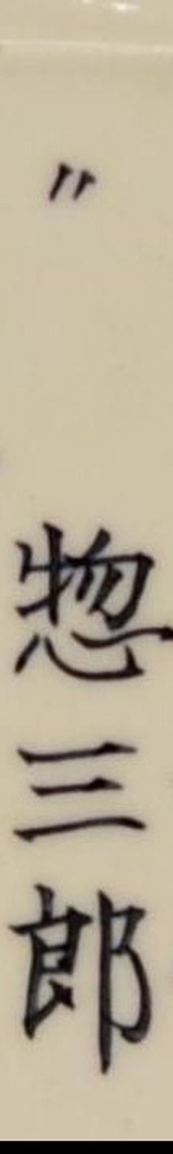惣三郎
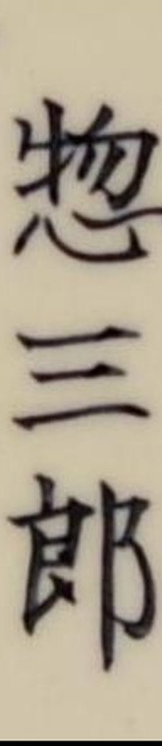惣三郎
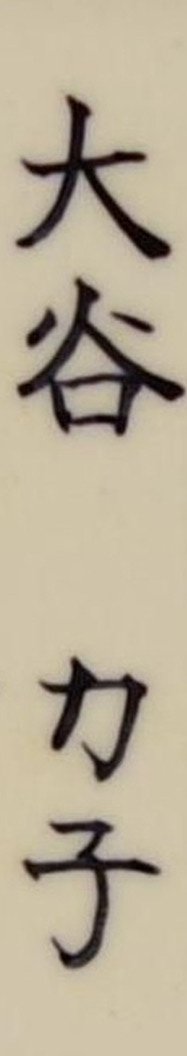大谷力子
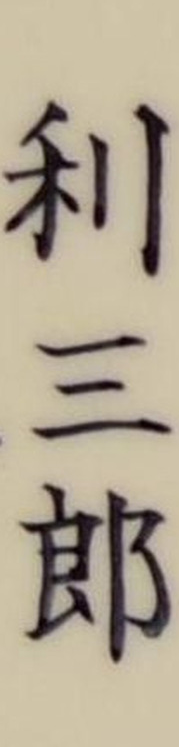利三郎
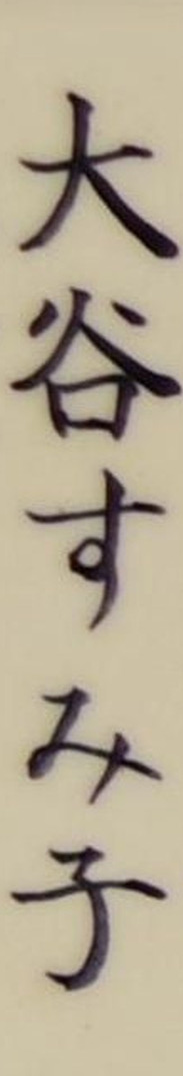大谷すみ子
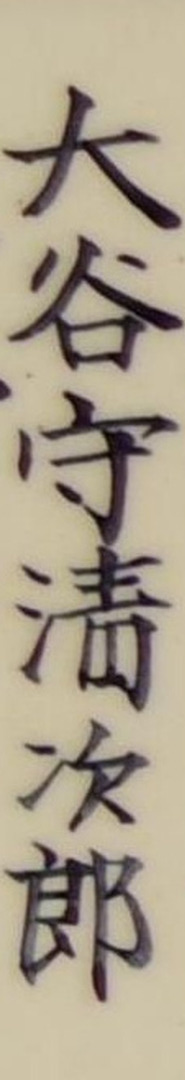大谷守清次郎
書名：E~L
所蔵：高野山金剛峯寺
